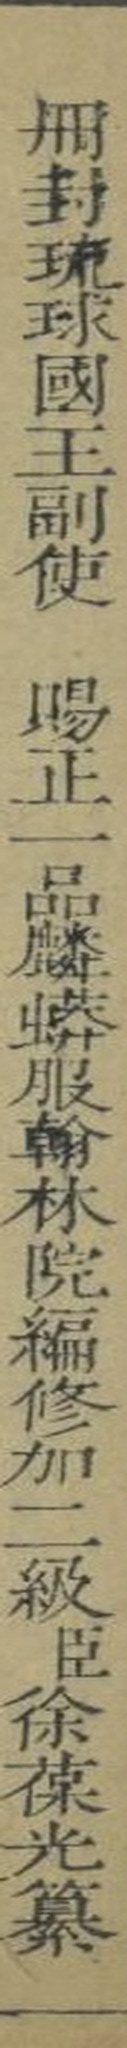冊封琉球國王副使賜正一品麟蟒服翰林院編修加二級臣徐葆光纂
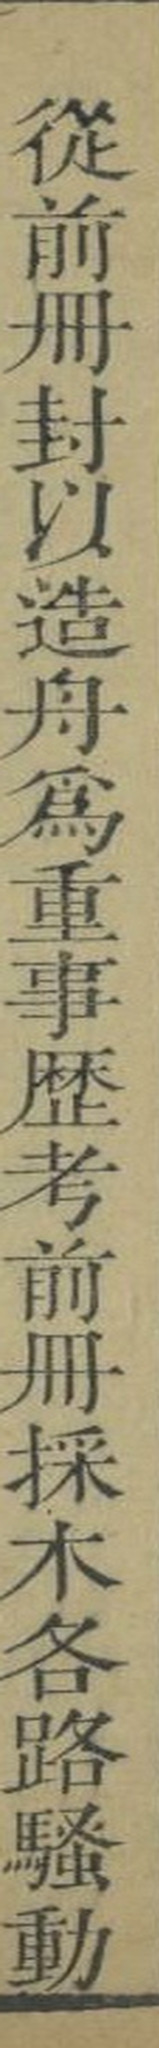從前冊封以造舟爲重事歴考前冊採木各路騷動
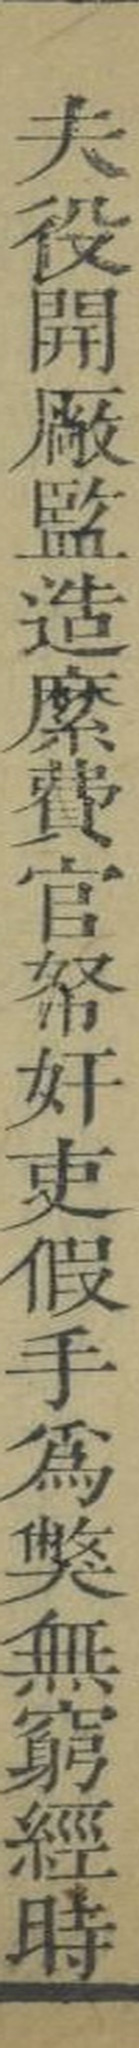夫役開厰監造縻費官帑奸吏假手爲獘無窮經時
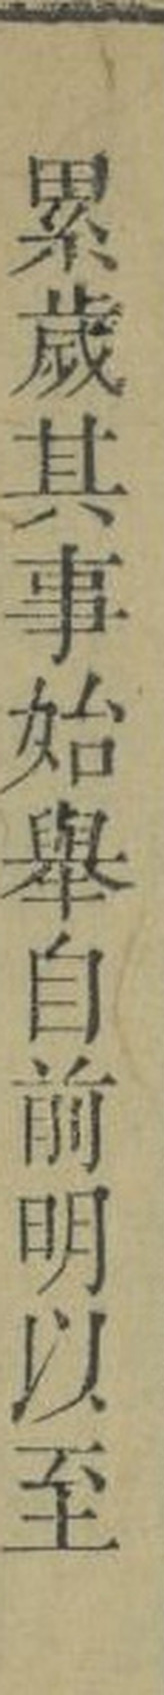累歲其事始舉自前明以至
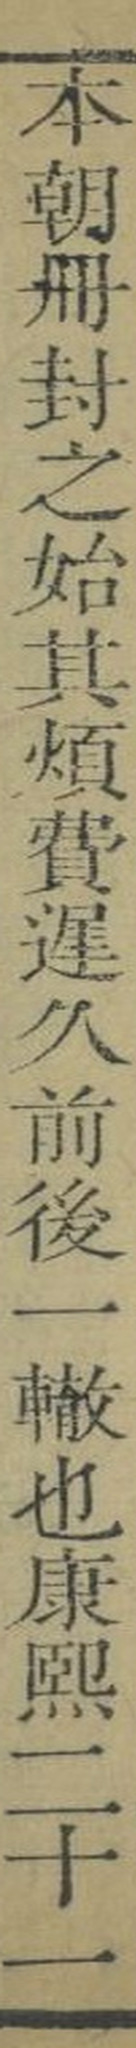本朝冊封之始其煩費遲久前後一轍也康熙二十一
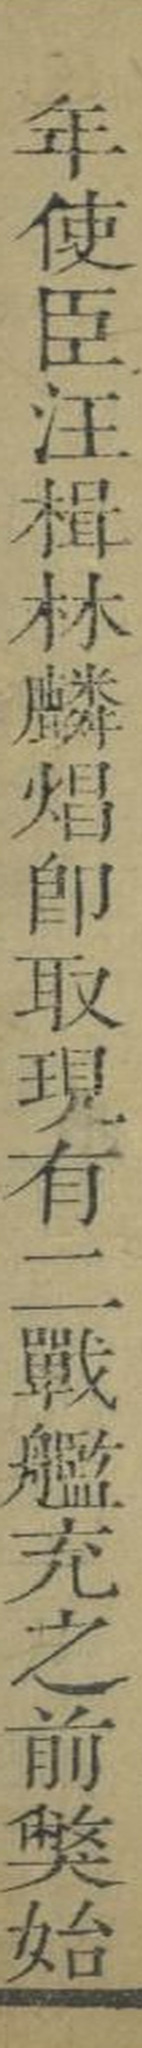年使臣汪楫林麟焻卽取現有二戰艦充之前獘始
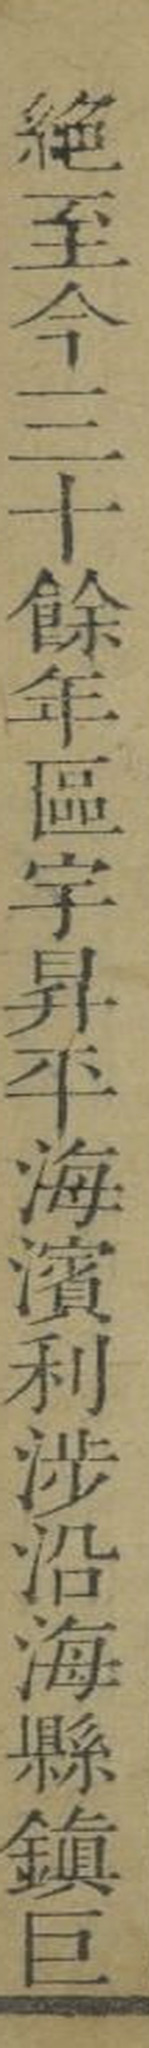絶至今三十餘年區宇昇平海濱利涉沿海縣鎭巨

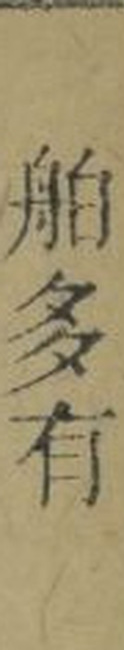舶多有
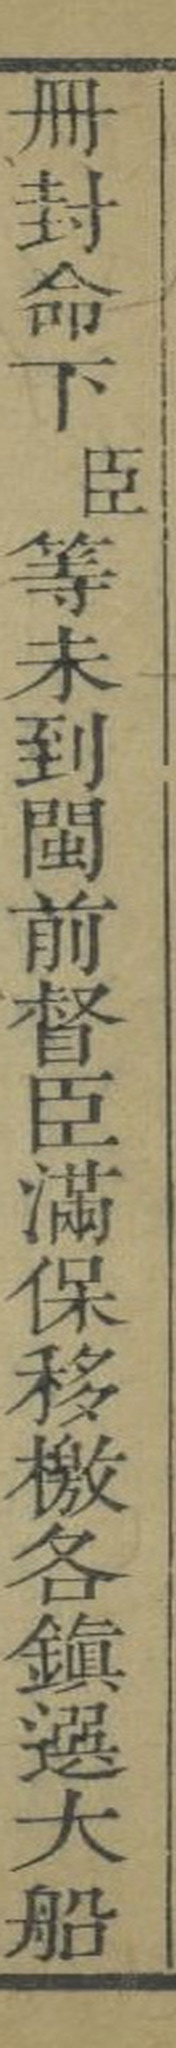冊封命下臣等未到閩前督臣滿保移檄各鎭選大船
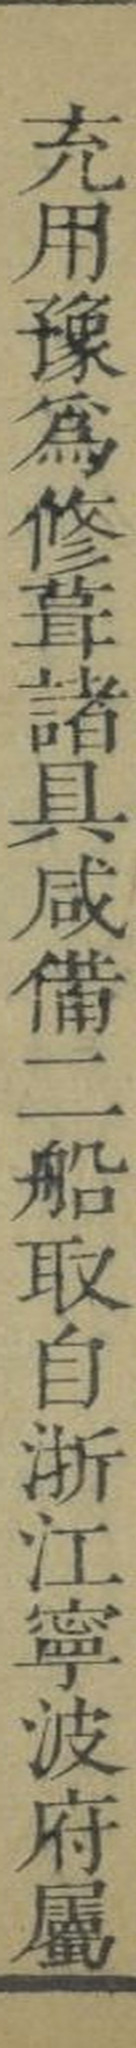充用豫爲修葺諸具咸備二船取自浙江寧波府屬
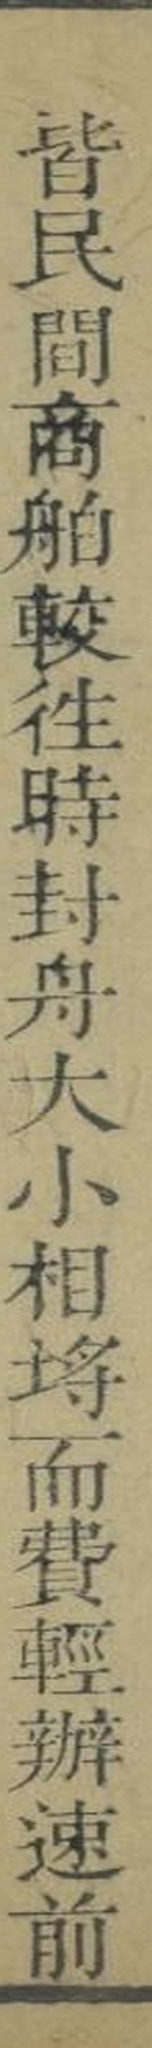皆民間商舶較徃時封舟大小相埓而費輕辦速前
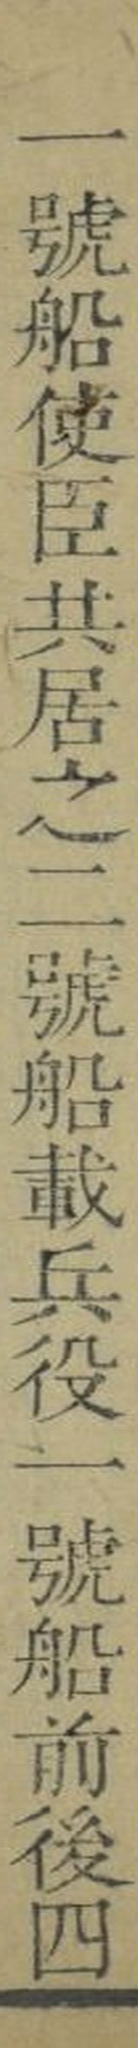一號船使臣共居之二號船載兵役一號船前後四
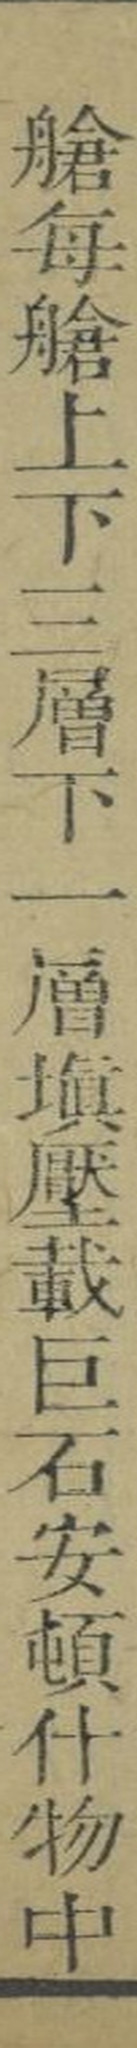艙每艙上下三層下一層塡壓載巨石安頓什物中
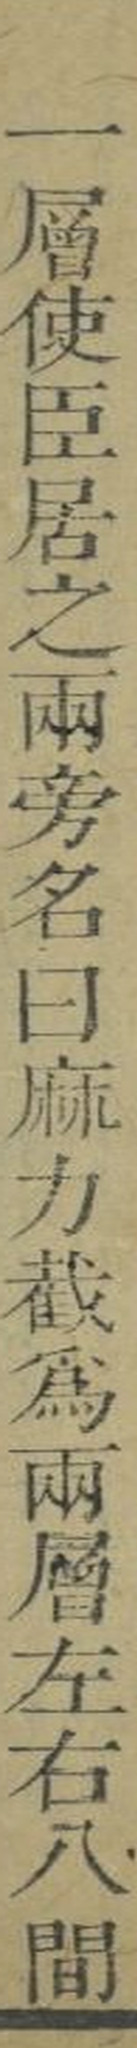一層使臣居之兩旁名曰麻力截爲兩層左右八間
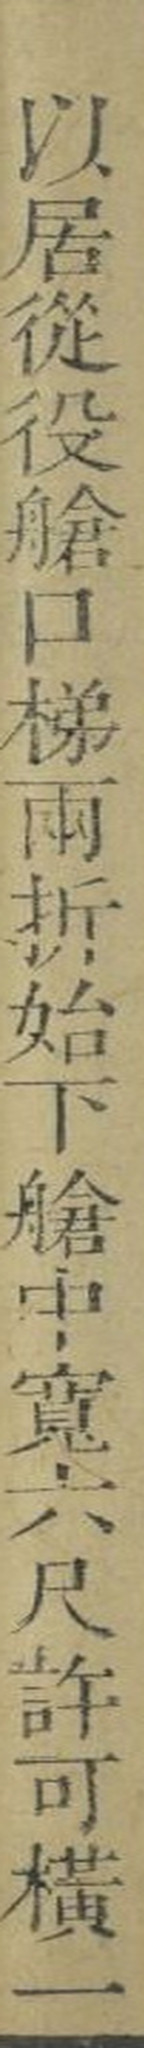以居從役艙口梯兩折始下艙中寬六尺許可橫一
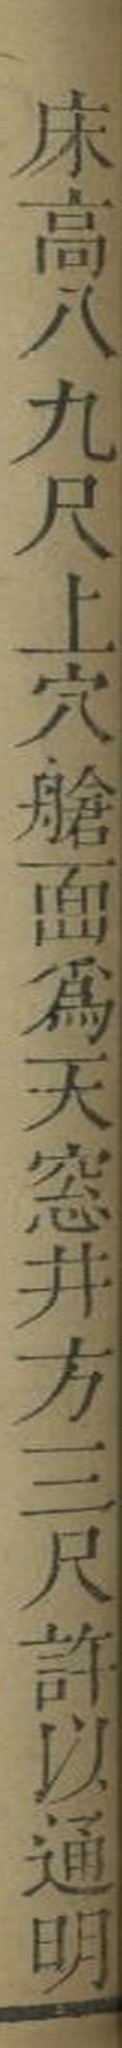床高八九尺上穴艙面爲天窓井方三尺許以通明
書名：中山伝信録 巻一
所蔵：University of the Ryukyus Library
